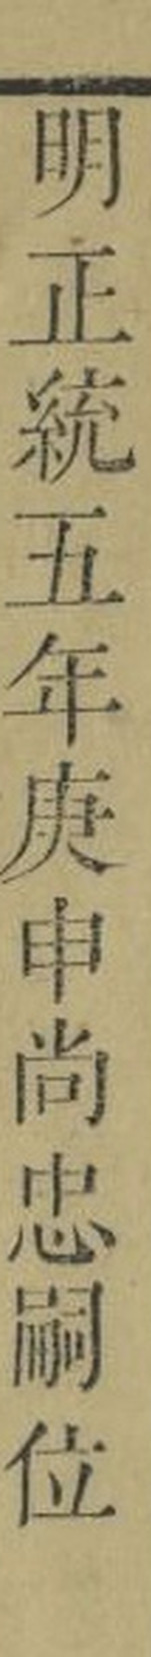明正統五年庚申尚忠嗣位
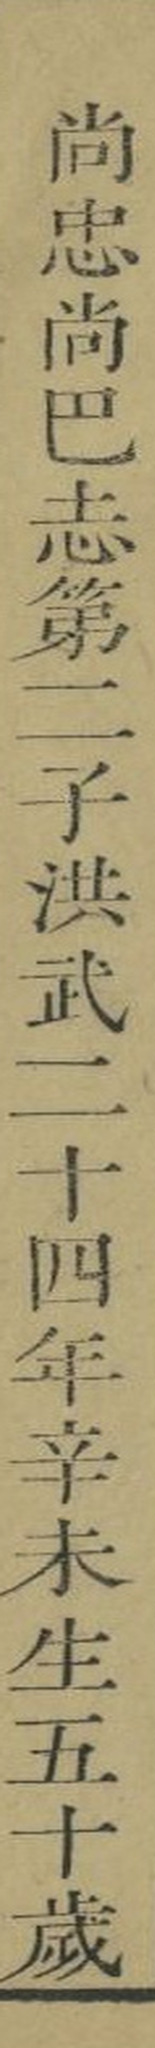尚忠尚巴志第二子洪武二十四年辛未生五十歳
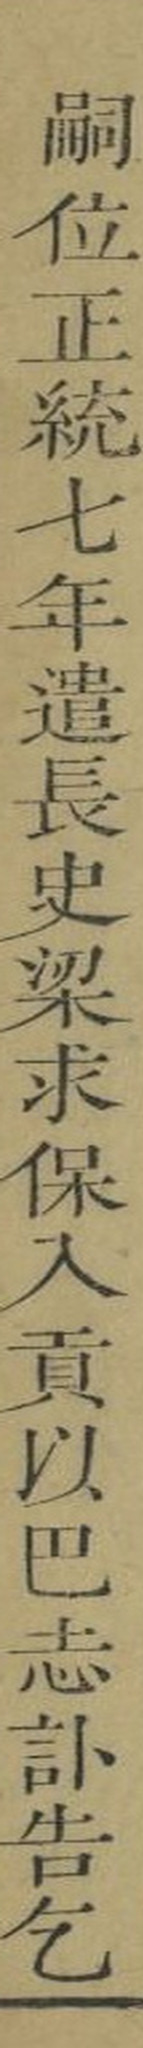嗣位正統七年遣長史梁求保入貢以巴志訃告乞

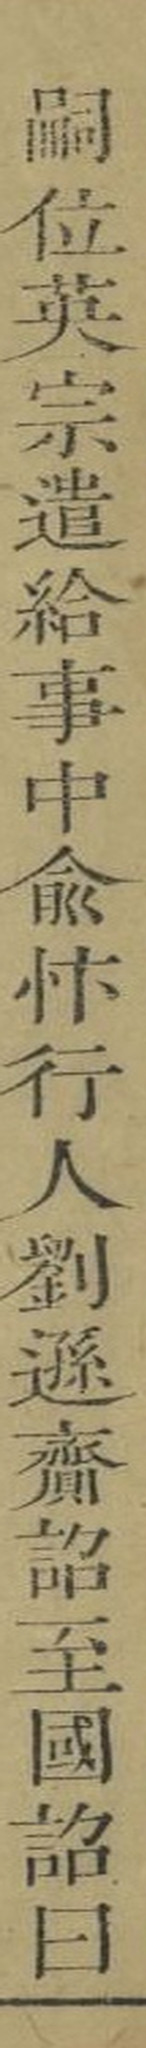嗣位英宗遣給事中兪忭行人劉遜齎詔至国詔曰
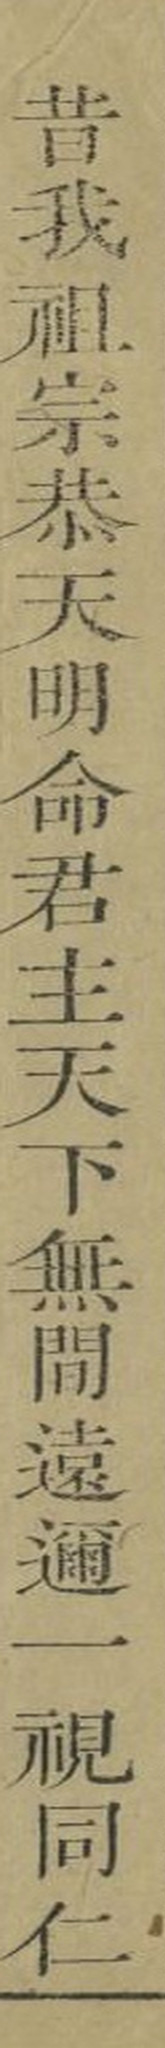昔我祖宗恭天明命君主天下無間遠邇一視同仁
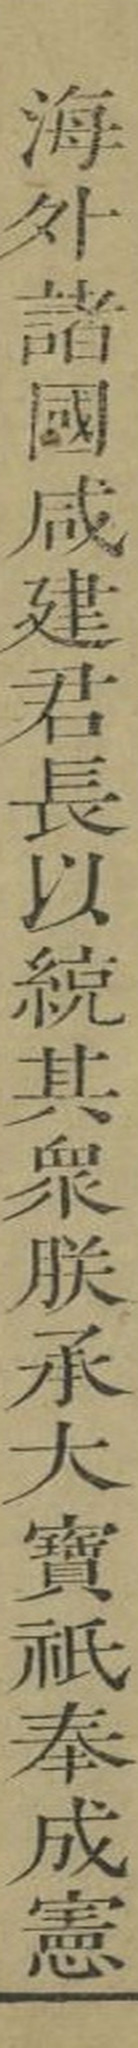海外諸国咸建君長以統其衆朕承大宝祇奉成憲
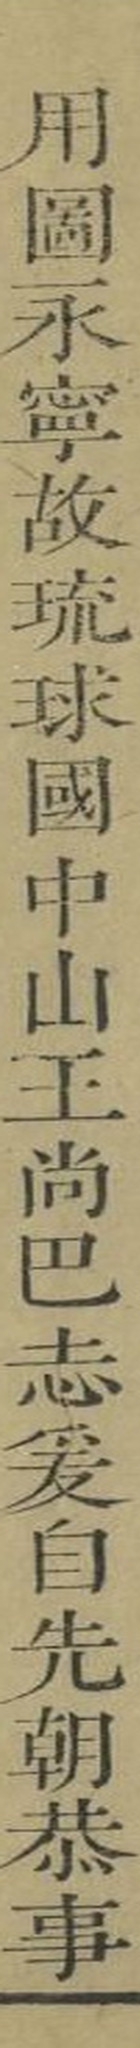用図永寧故琉球国中山王尚巴志爰自先朝恭事
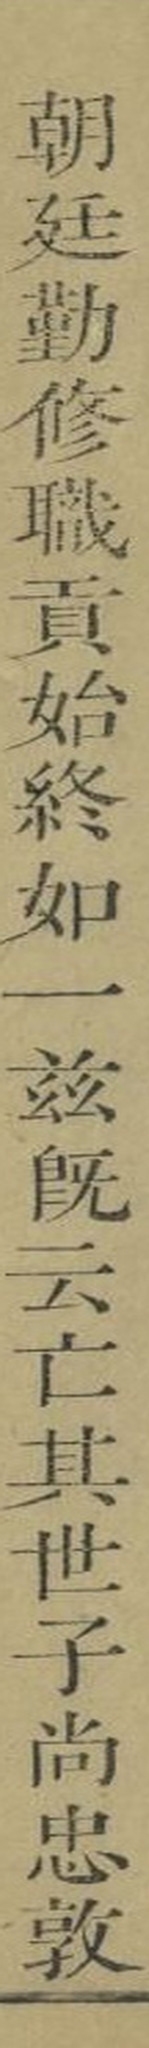朝廷勤修職貢始終如一茲既云亡其世子尚忠敦
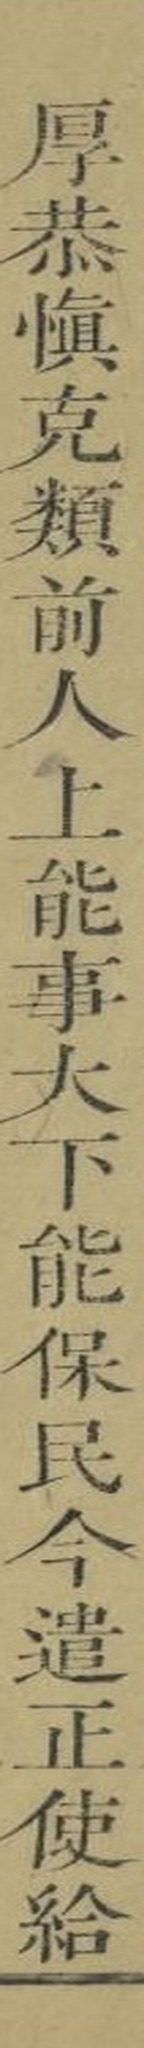厚恭慎克類前人上能事大下能保民今遣正使給
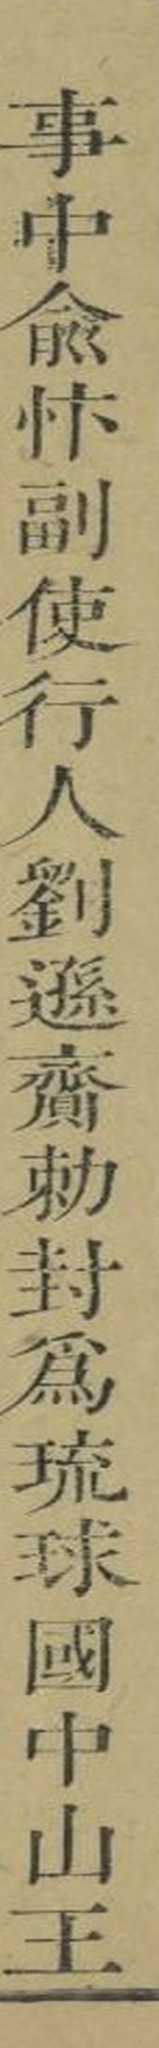事中兪忭副使行人劉遜齎勅封為琉球国中山王
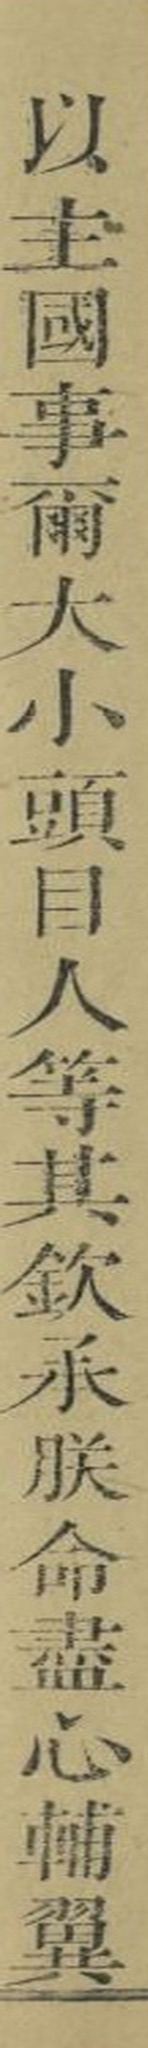以主国事爾大小頭目人等其欽承朕命尽心輔翼
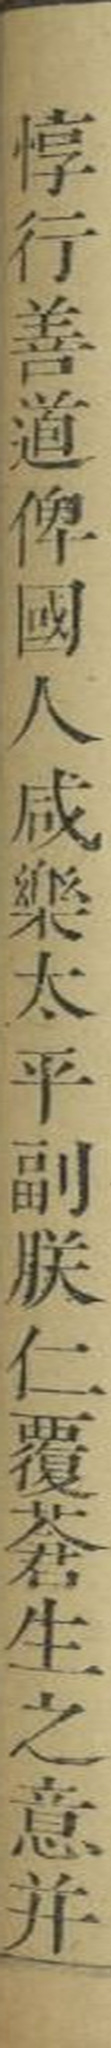惇行善道俾国人咸楽太平副朕仁覆蒼生之意并
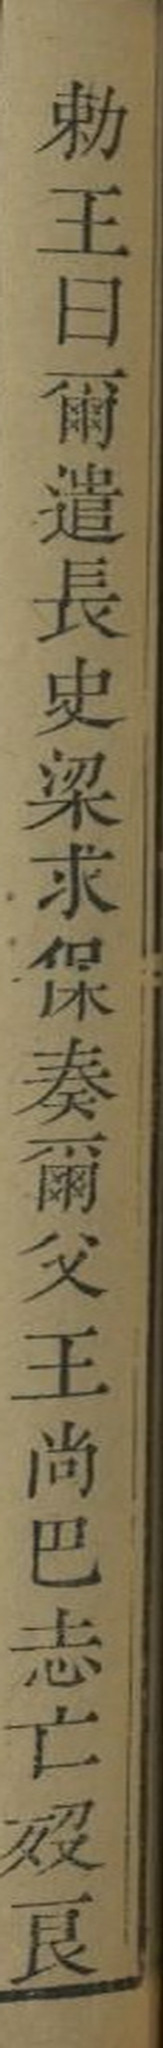勅王曰爾遣長史梁求保奏爾父王尚巴志亡歿良
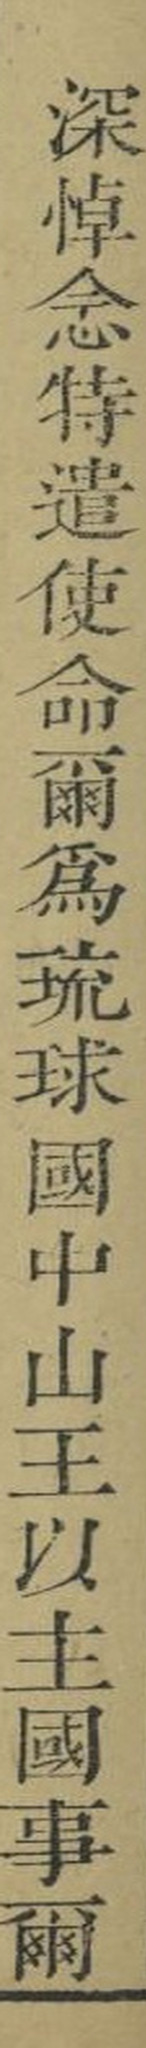深悼念特遣使命爾為琉球国中山王以主国事爾
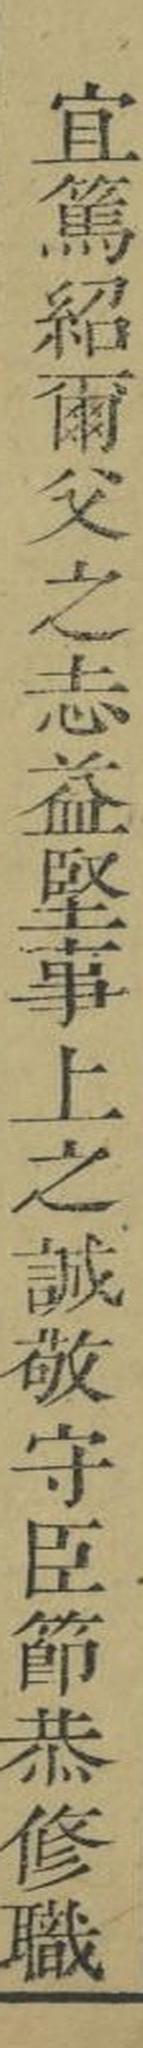宜篤紹爾父之志益堅事上之誠敬守臣節恭修職
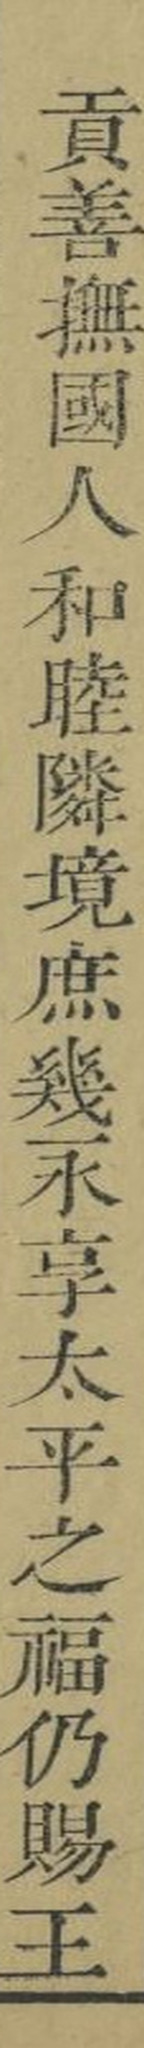貢善撫国人和睦隣境庶幾永享太平之福仍賜王
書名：中山伝信録 巻三
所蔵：University of the Ryukyus Library
